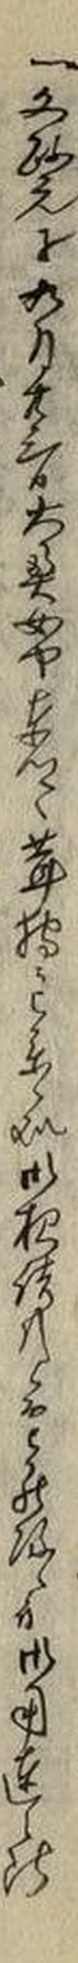一文政元寅九月廿三日大奥女中東郷へ茸狩に被参候処御夜詰引に而罷帰候に付御用達之断
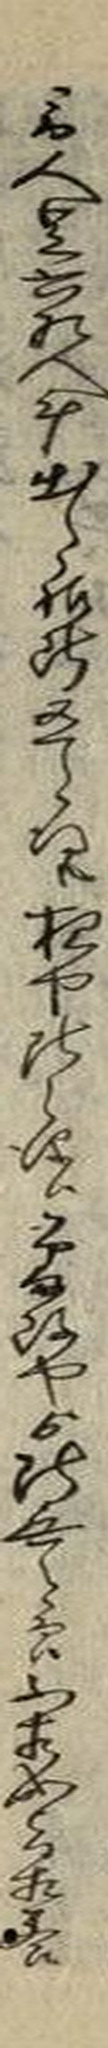に而人足六拾人斗出候様断有之候得共夜中断之儀は御番改中ゟ断無之候而は不相成候旨相答
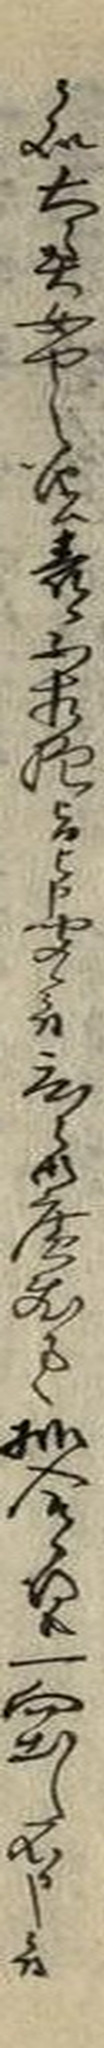候処大奥女中之儀は表へ不相拘旨被申聞候に付度々御広敷方へ掛合候得共一向出し不申候に付
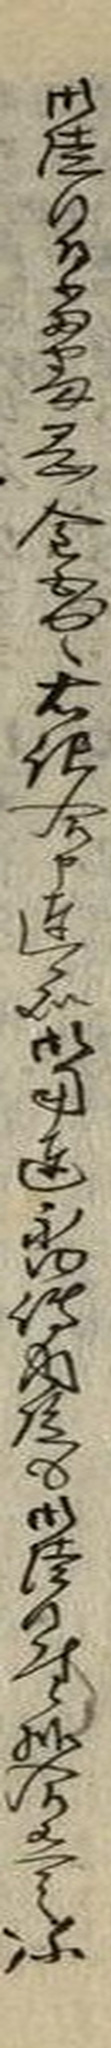御徒目付当番岡金五右衛門へ右訳合申達候処御用達永田伝内殿も御徒目付へ掛合有之弥
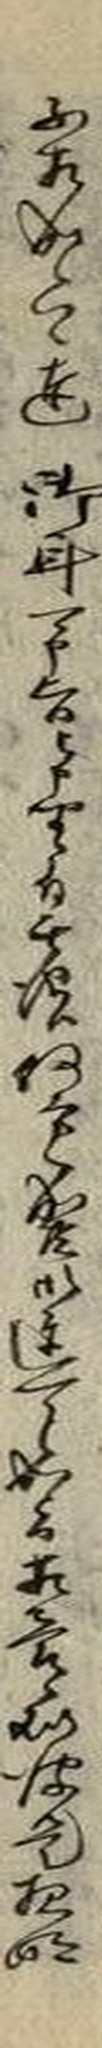不相成候はゝ達御耳可申旨被申聞候に付其儀は何方へ成共御達可成候旨相答候処彼是夜明
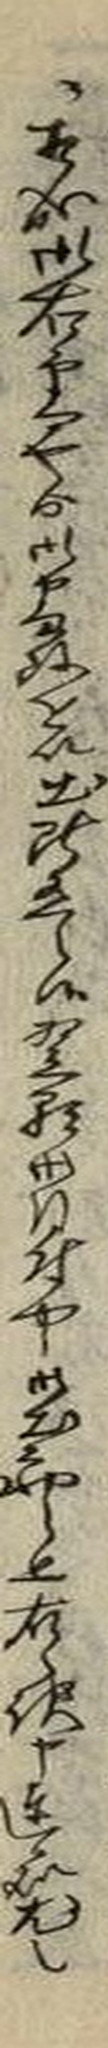に相成御右筆部やゟ御当番を以出断有之候翌朝御目付中出勤之上右之訳申達候処尤之
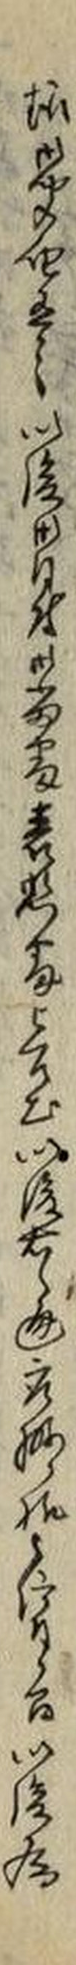趣御聞届有之以後御目付御当番表御門番被召出以後右之通取扱候様被仰付候間以後為
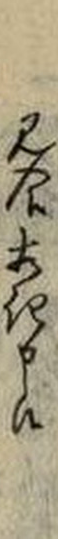見合相記申候
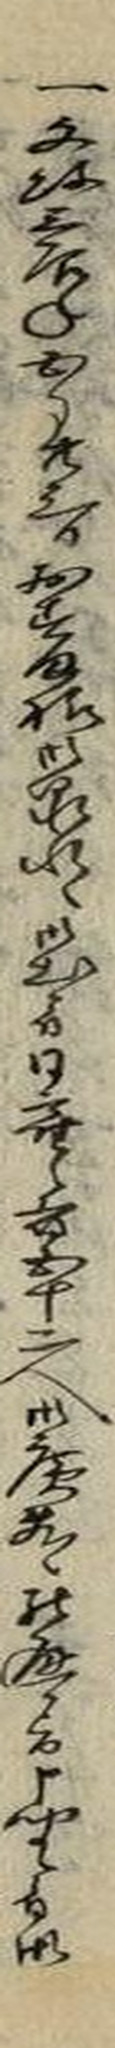一文政三辰年五月廿三日おすま様御泉水へ御出に付日雇之者五十二人御座敷へ罷通候旨申聞候ニ付御
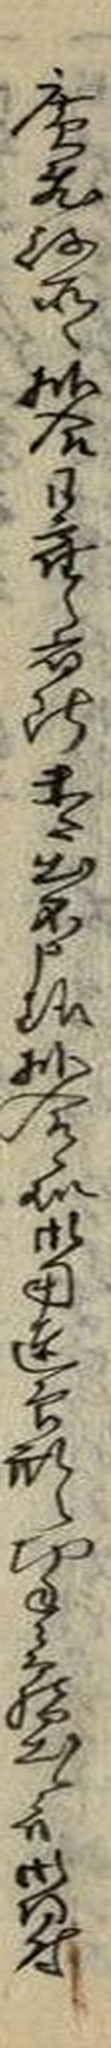広敷役所へ掛合日雇之者断未た出不申趣掛合候処御用達印形之切手に而指出候に付御目付
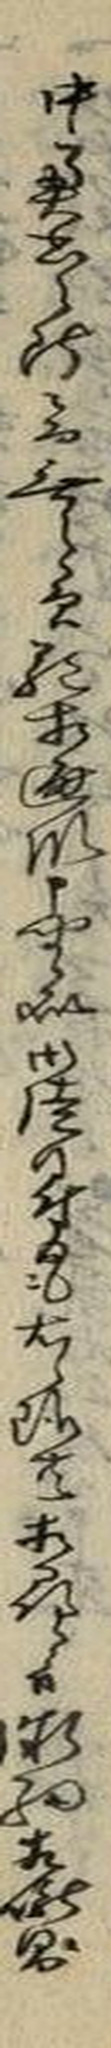中奥書之断に而無之候而は難相通候段申聞候処御徒目付方も右之趣共相尋候に付漸細相噺則
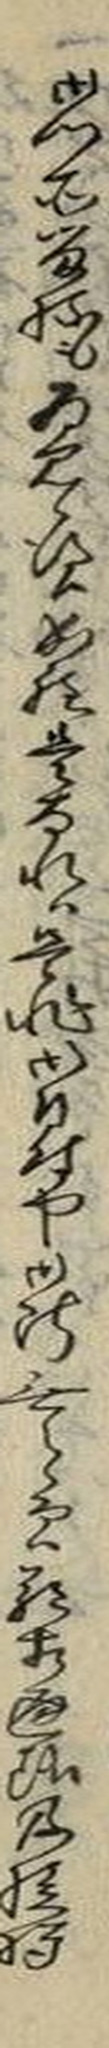御門所留抔も為見候得は成程是なれは是非御目付中御断無之候而は難相通趣及挨拶
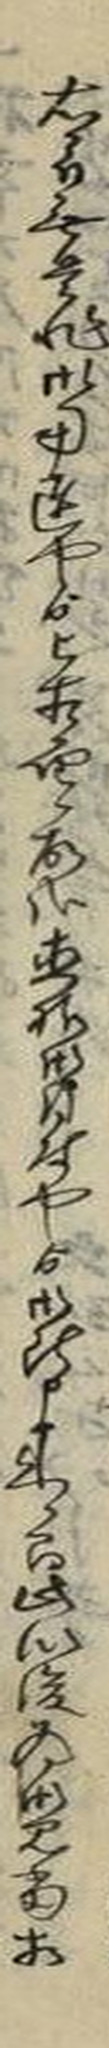右に付無是非御用達中ゟ被相届候故哉直様御目付中ゟ御断申来候間以後以後為御見当相
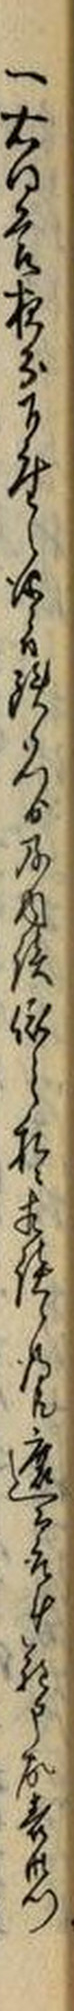一右同節夜分下座之儀に付鉄御門ゟ及内談依之折々相談候得共遮而取斗難申候故表御門
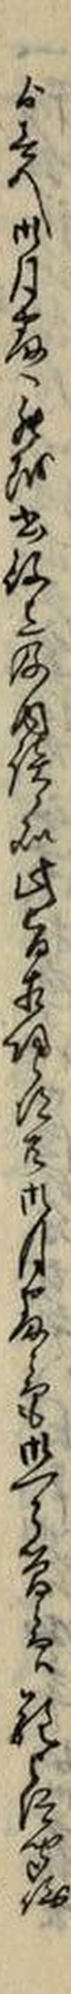ゟ壱人御月番へ罷越書役迄及内談候処此旨相伺候得共御月番に而も御了簡に而は難被仰聞儀
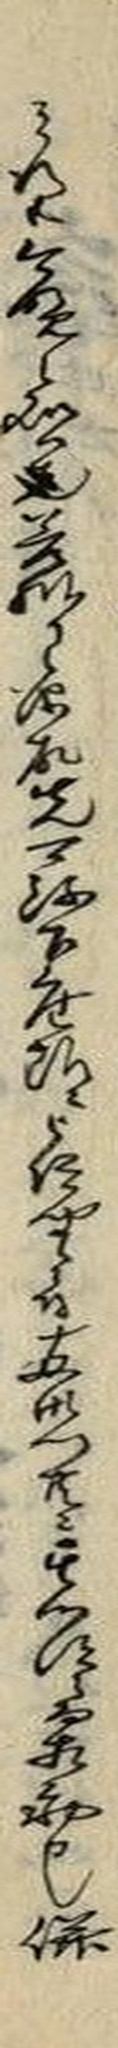に候得共今晩之処は差掛り之儀故先可致下座趣に被仰聞候に付両御門共に其心得に而相勤申候併
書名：御門御櫓之部
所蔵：福井県文書館 Fukui Prefectural Archives
